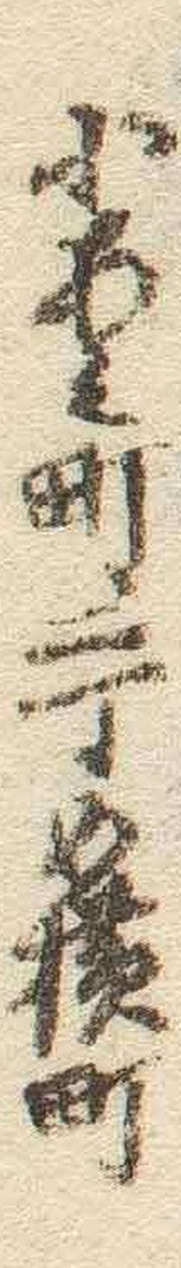小あみ町二丁め横町
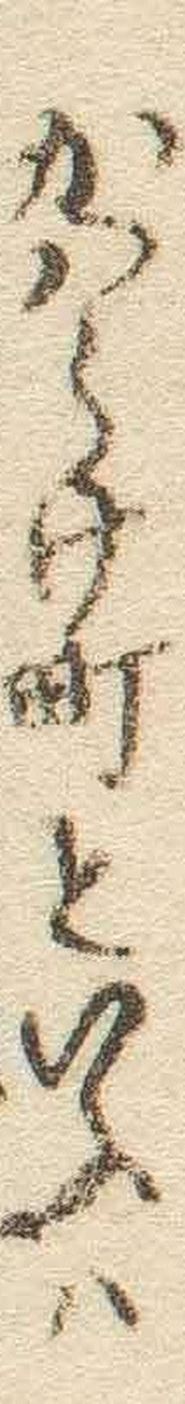かはらけ町といふは
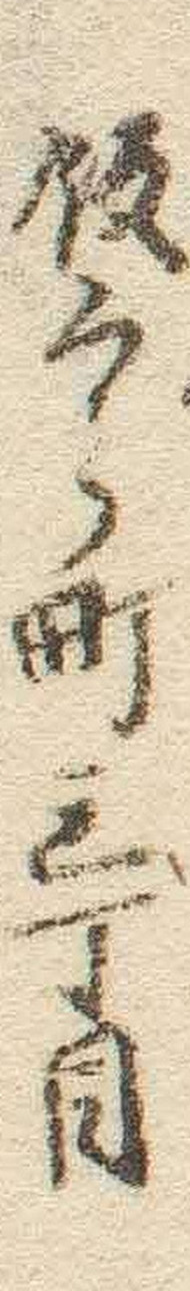飯くら町三丁目
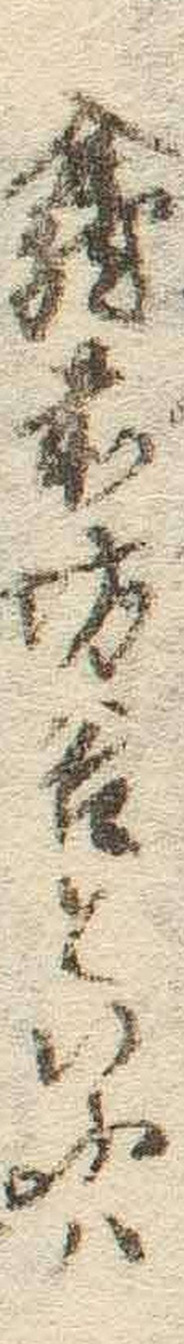龕前坊谷といふは
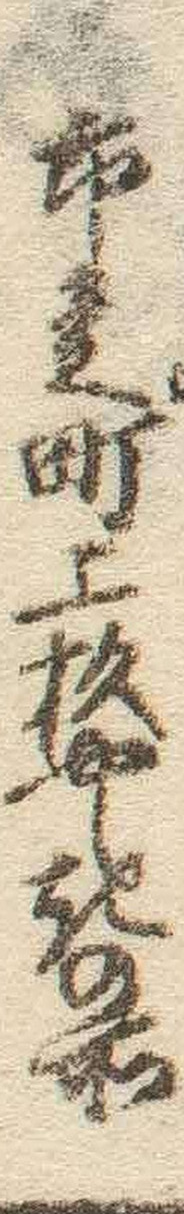市兵へ町上杉やしきの所
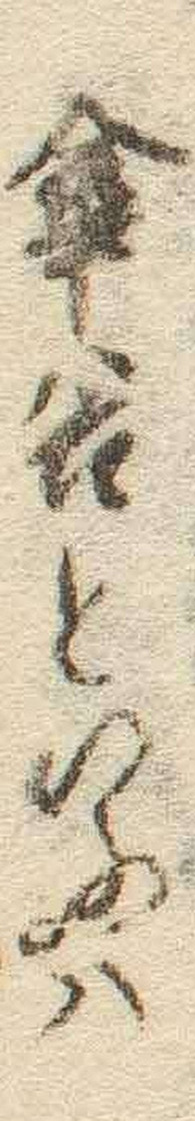傘谷といふは
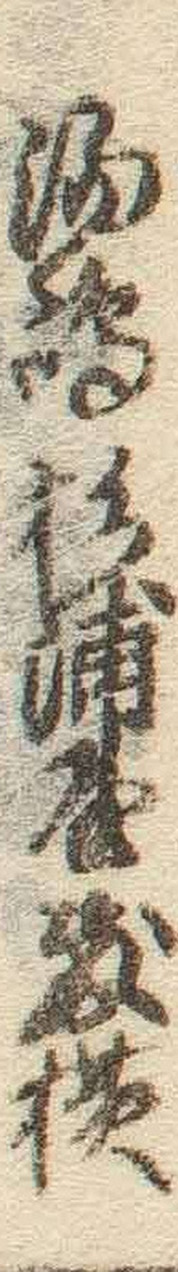湯島杉浦屋敷横
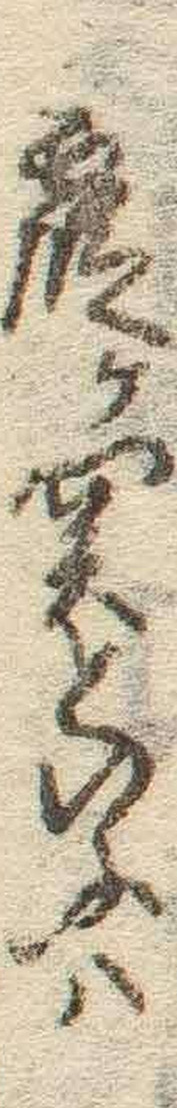霞ヶ関といふは
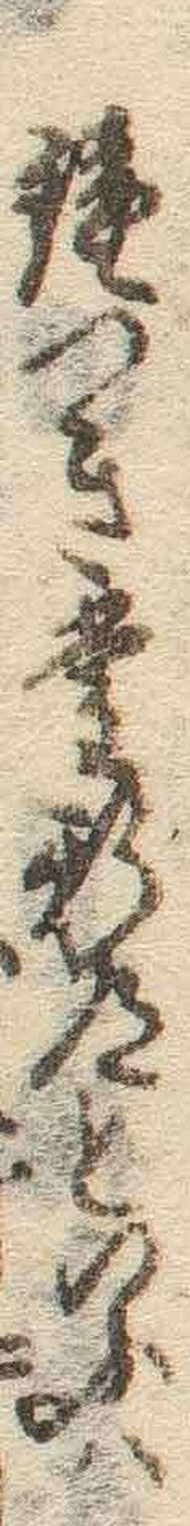鐘つき堂新道といふは
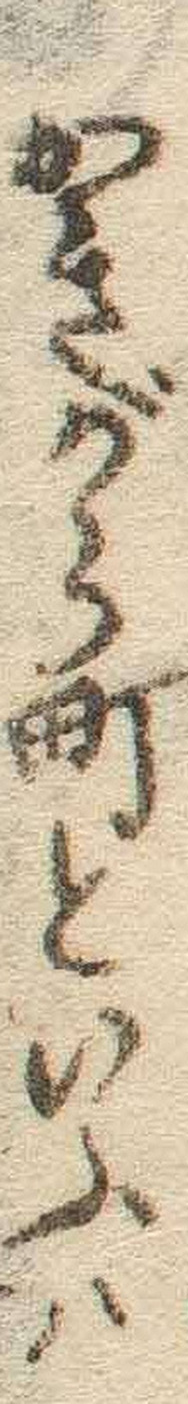かきがら町といふは
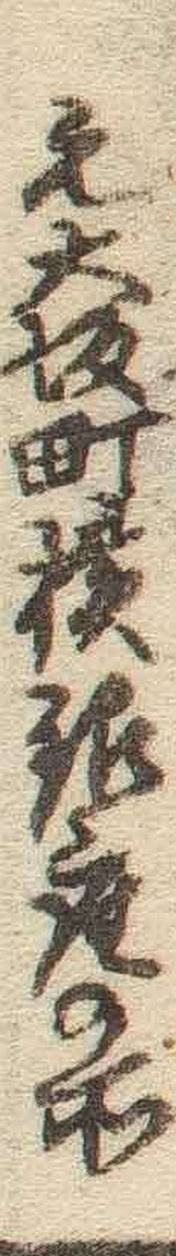元大坂町横銀座の所

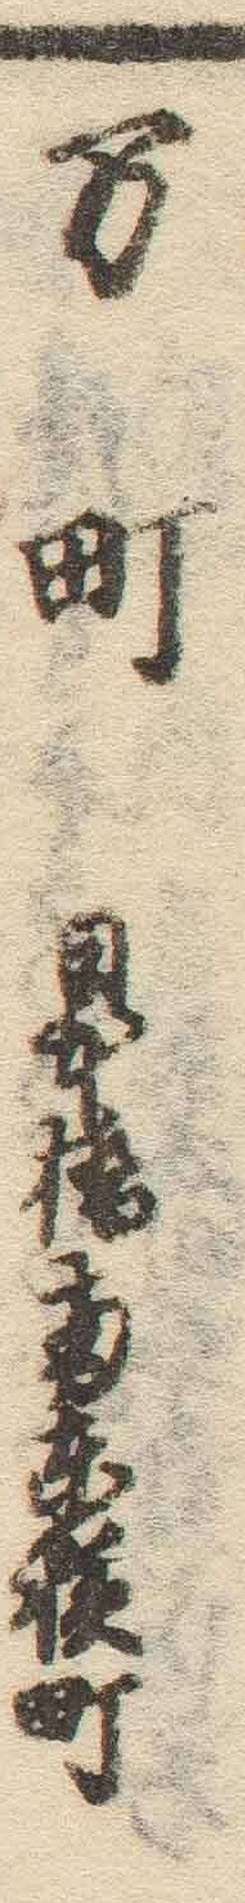万町日本橋南東横町
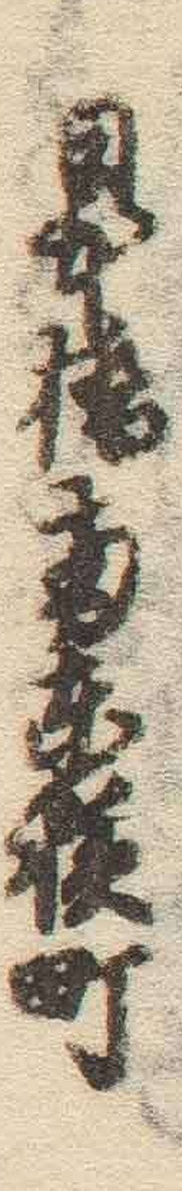万町日本橋南東横町
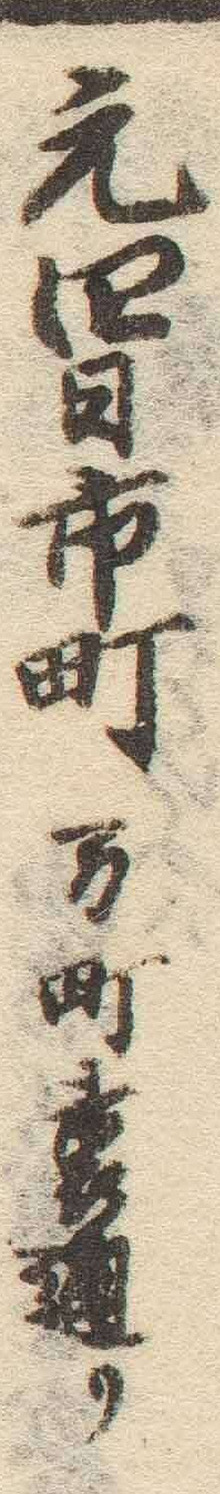元四日市町万町裏通り
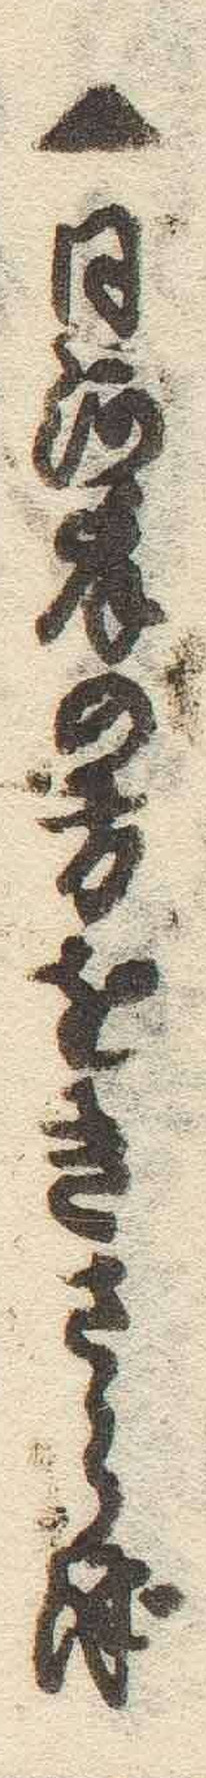▲同河岸の方をきさらづ
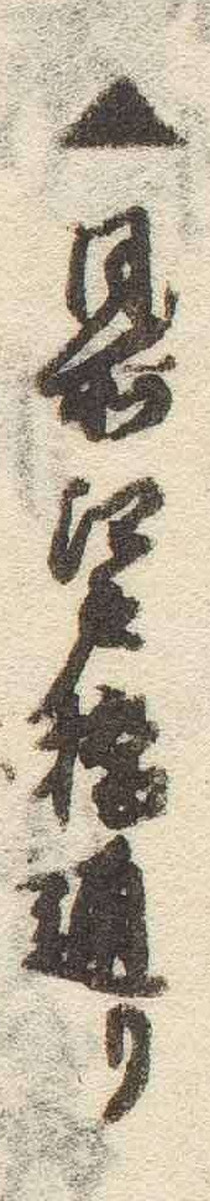▲同所江戸橋通り
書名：江戸町独案内
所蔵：東京学芸大学附属図書館 国文学研究資料館
